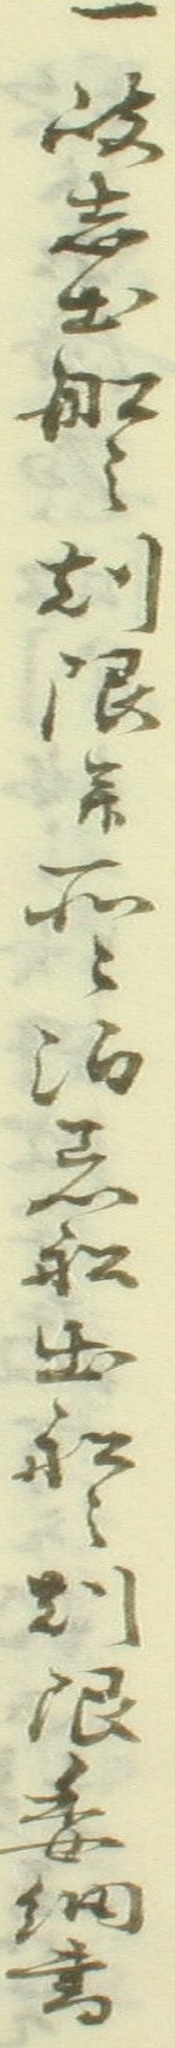一岐志出船之刻限并所々泊着船出船之刻限委細書
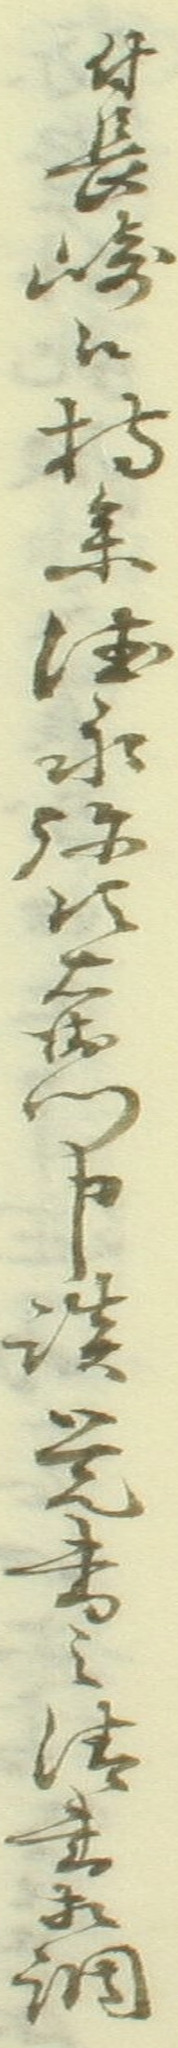付長崎え持参徳永弥次右衛門申談覚書之清書相調
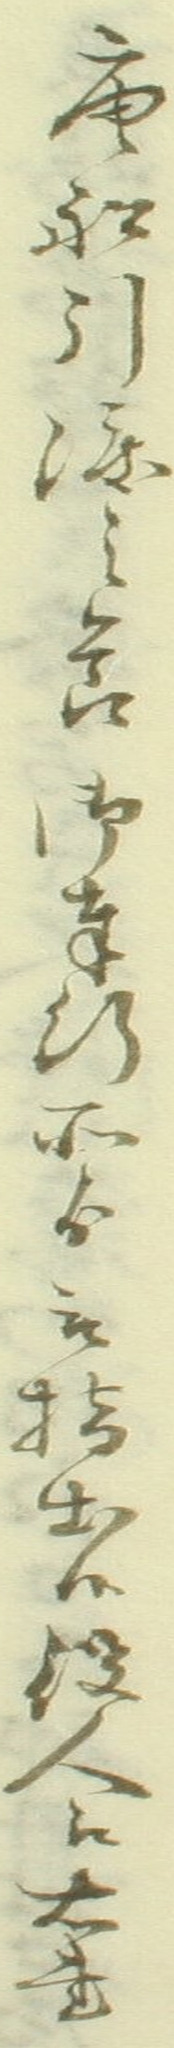唐船引渡之節御奉行所ゟ被指出候役人え右書
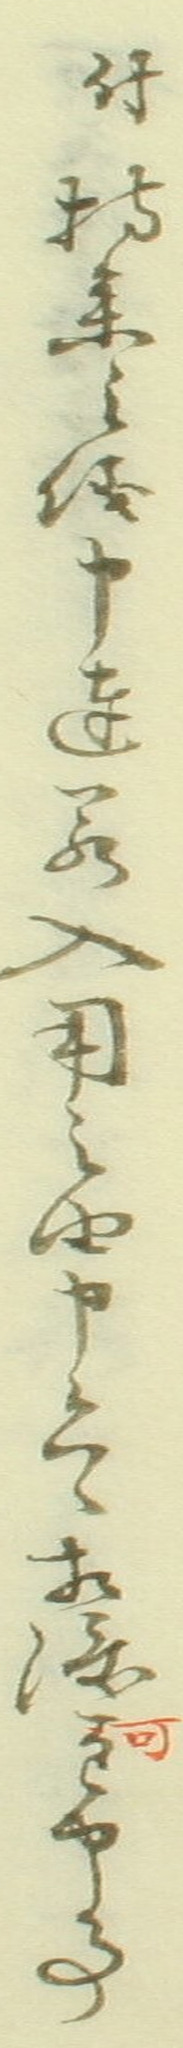付持参之儀申達若入用之由申候はゝ相渡可被申事
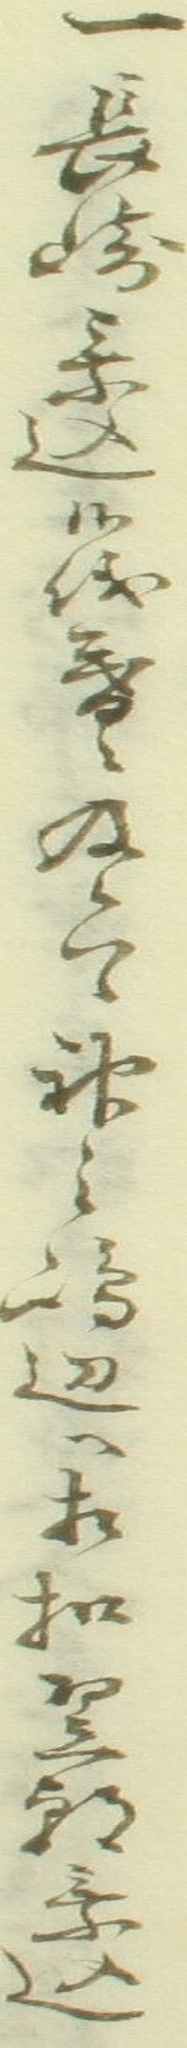一長崎乗込候儀暮に及候はゝ神之嶋辺へ相扣翌朝乗込
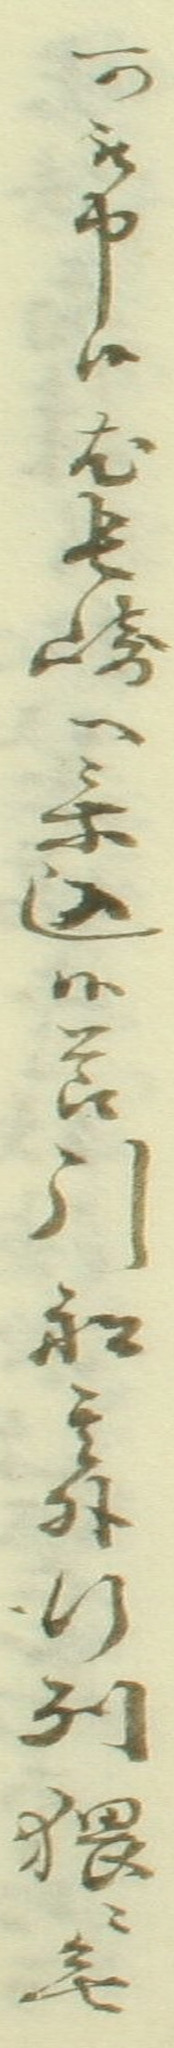可被申候尤長崎へ乗込候節引船其外行列猥に無
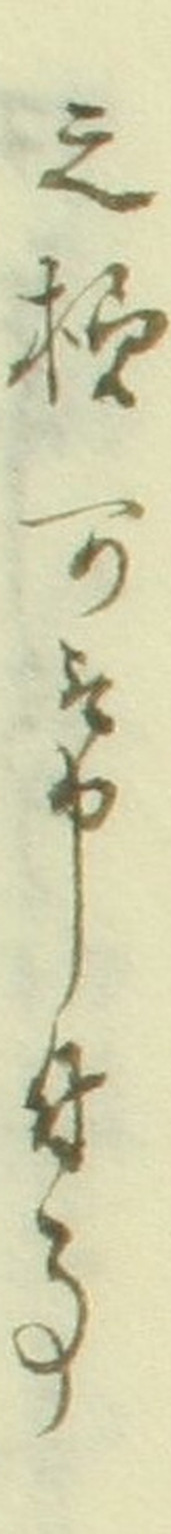之様可被申付事
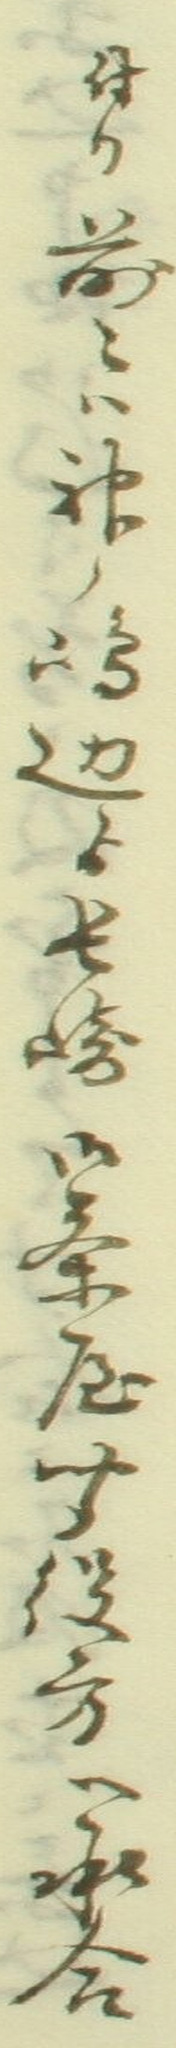付り前々は神ノ嶋辺ゟ長崎御茶屋聞役方へ承合

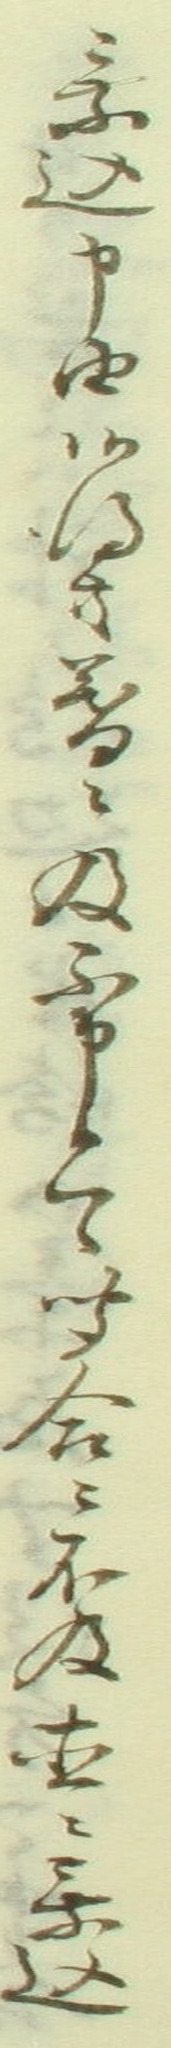乗込申由候得共暮に及不申候はゝ聞合に不及直に乗込
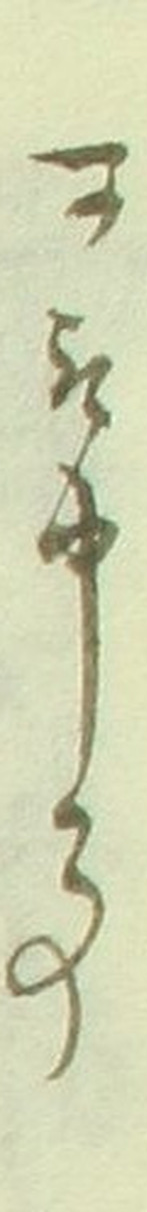可被申事
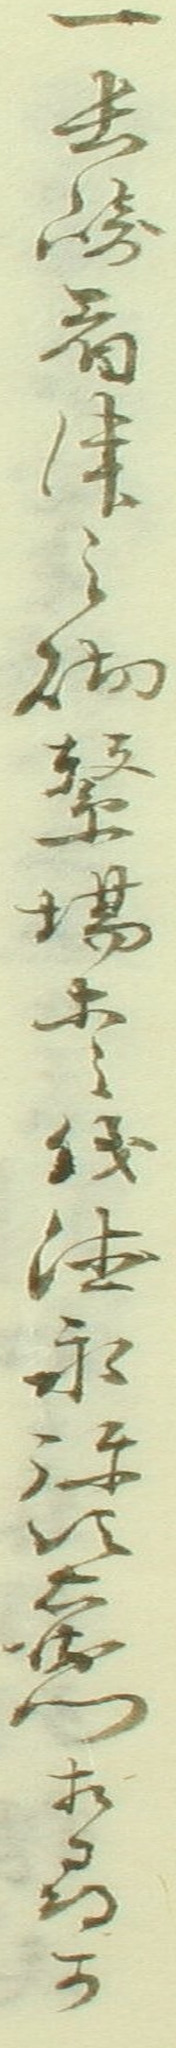一長崎着津之砌繋場等之儀徳永弥次右衛門相尋可
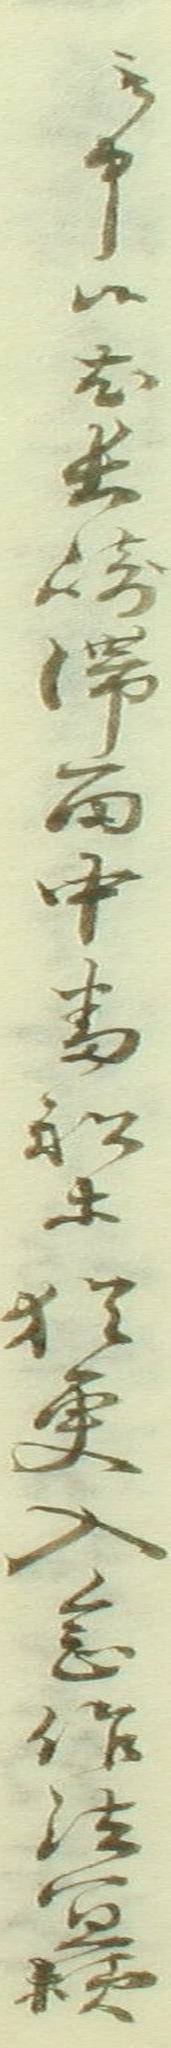被申候尤長崎滞留中番船等猶更入念作法宜様
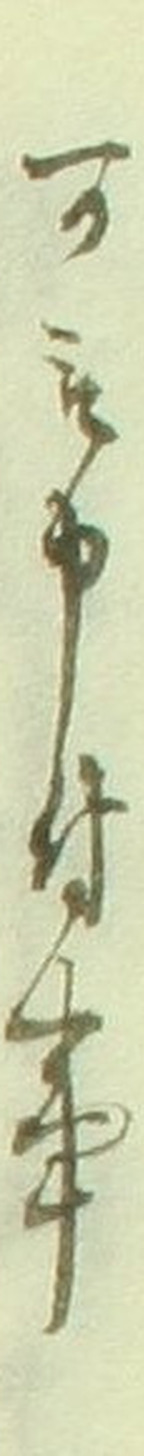可被申付事
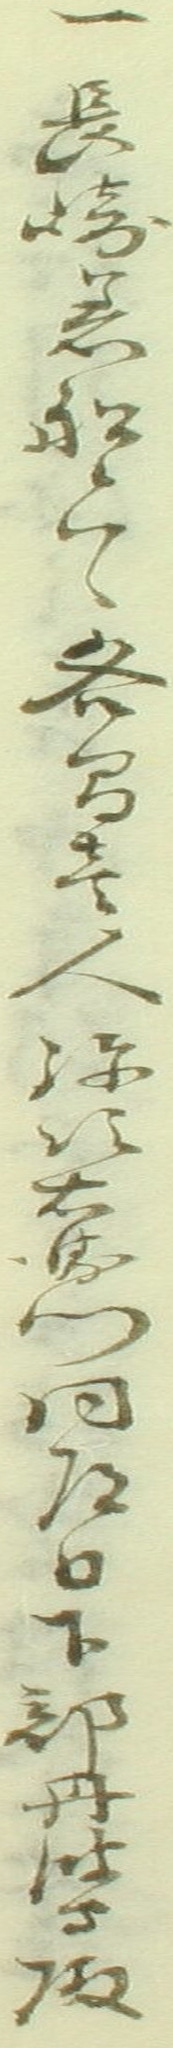一長崎着船候はゝ各間壱人弥次右衛門同道日下部丹波守殿
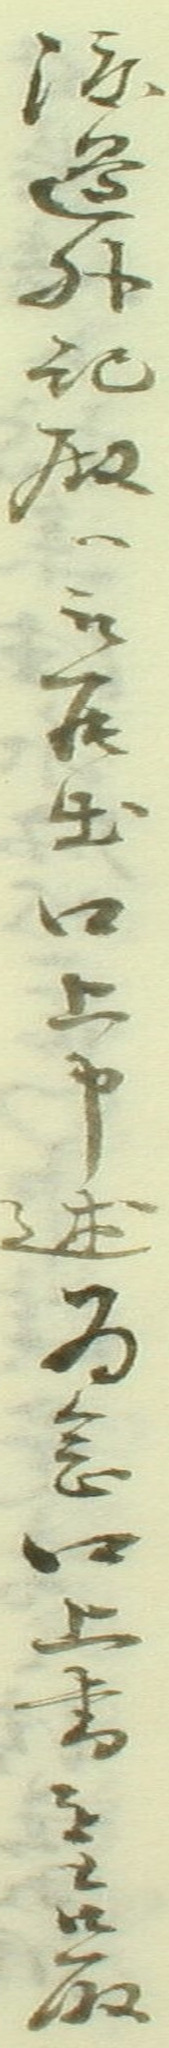渡辺外記殿は被罷出口上述為念口上書をも御取
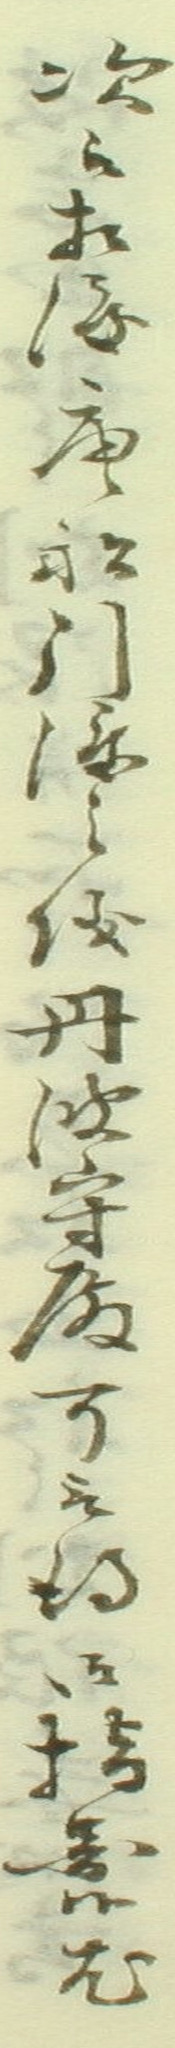次被相渡唐船引渡之儀丹波守殿可被得御指図候尤
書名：異国船漂着記
